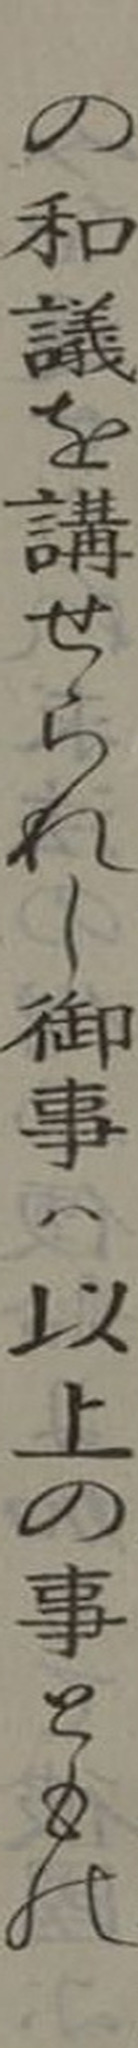の和議を講せられし御事は以上の事ともの
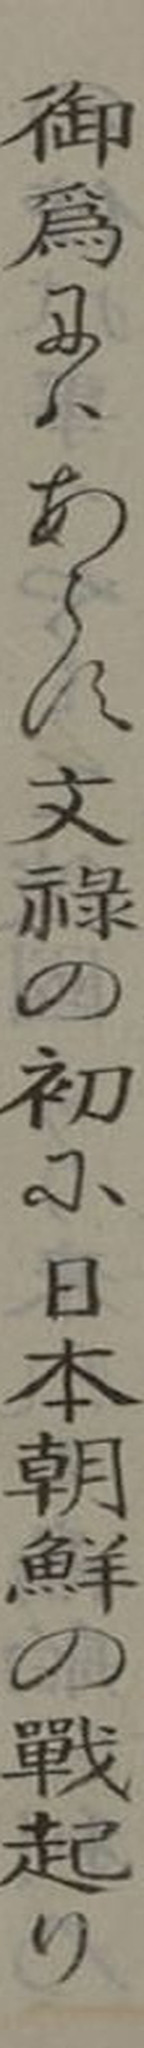御為にはあらす文祿の初に日本朝鮮の戰起り
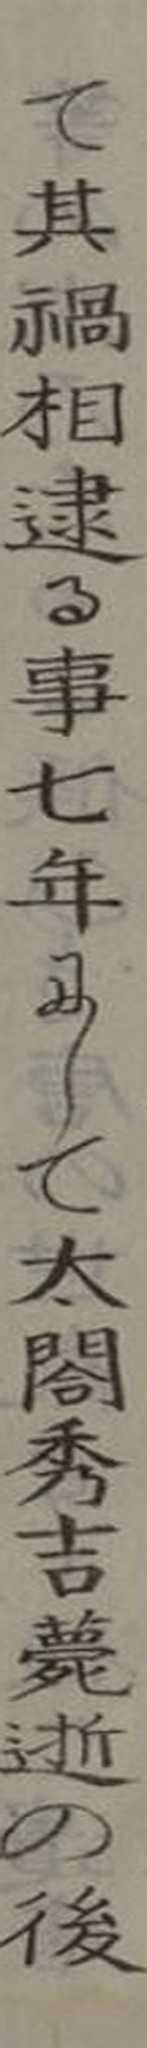て其禍相逮る事七年にして太閤秀吉薨逝の後
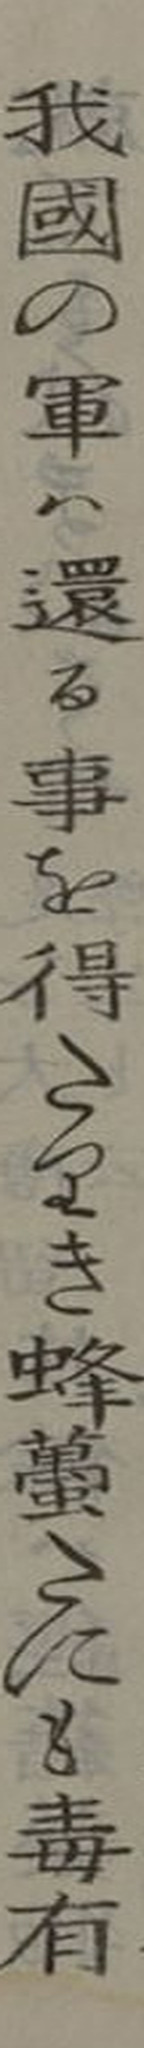我國の軍は還る事を得たりき蜂蠆たにも毒有
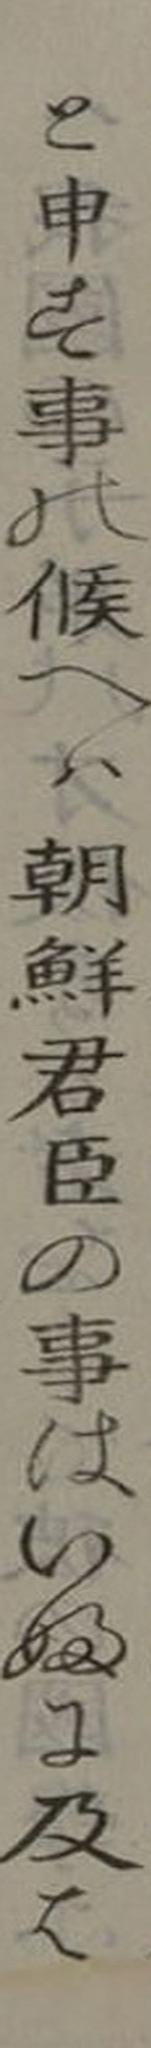と申す事の候へは朝鮮君臣の事はいふに及は
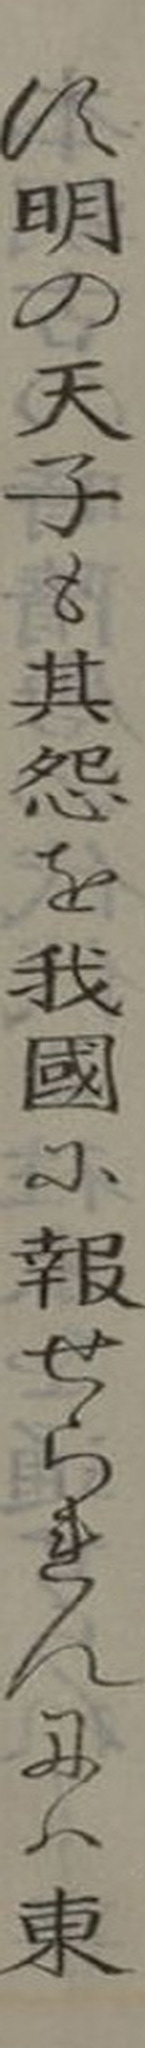す明の天子も其怨を我國に報せられんには東
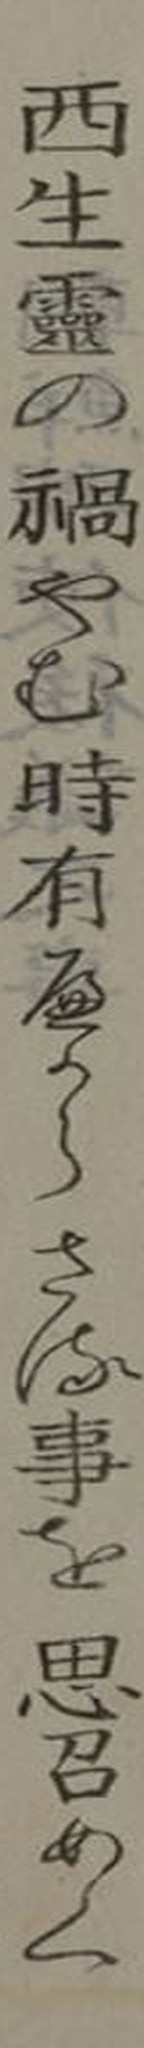西生靈の禍やむ時有へからさる事を思召めた
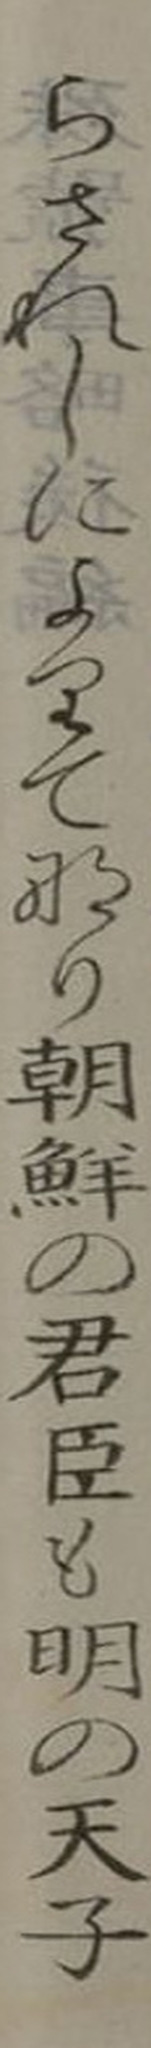らされしによりてなり朝鮮の君臣も明の天子
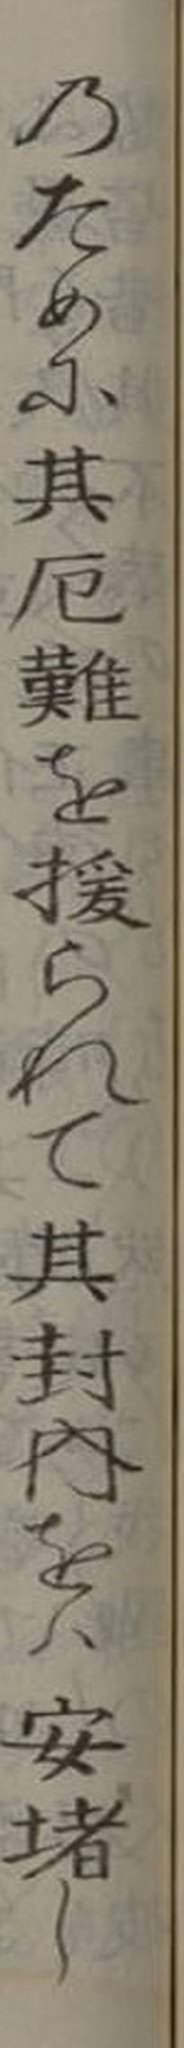のために其厄難を援られて其封内をは安堵し
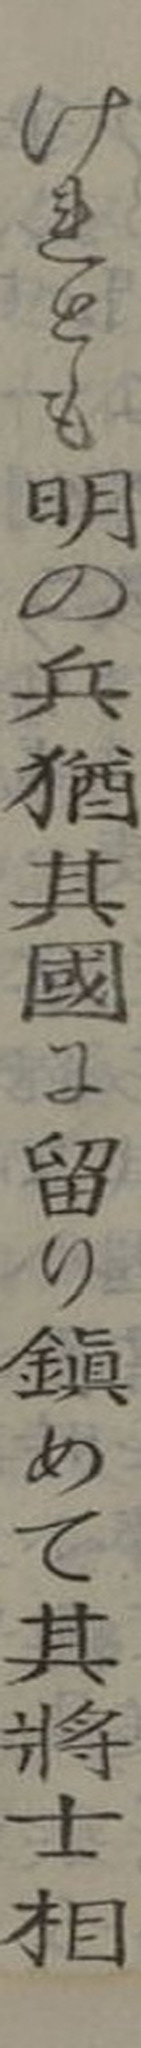けれとも明の兵猶其國に留り鎭めて其將士相
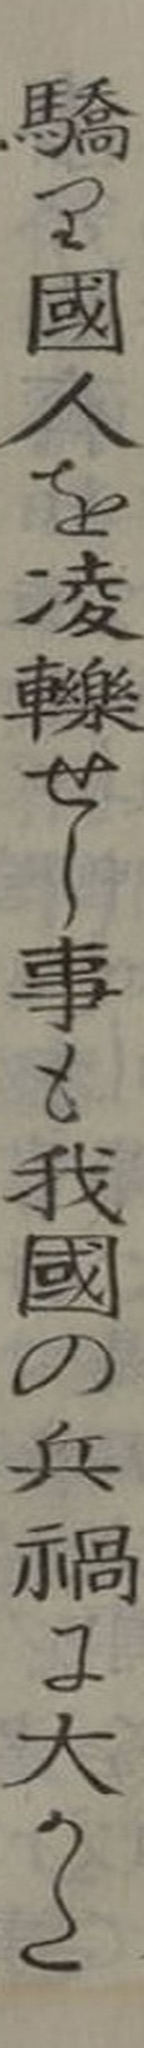驕り國人を凌轢せし事も我國の兵禍に大かた
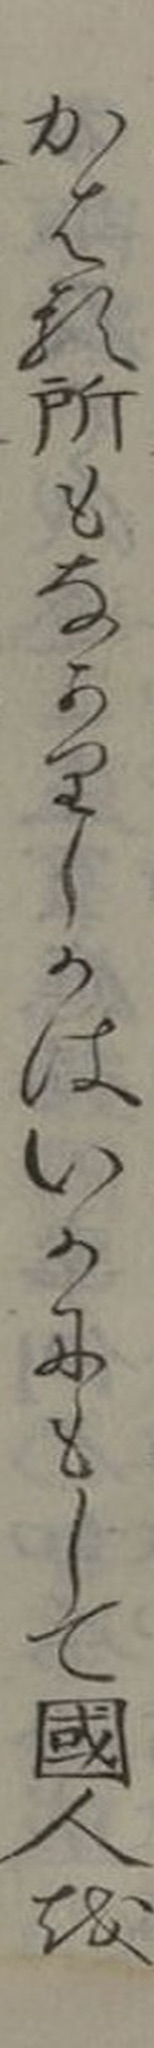かはる所もなかりしかはいかにもして國人を
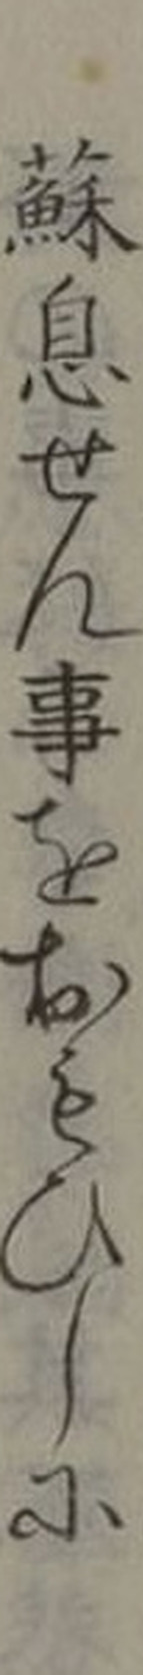蘇息せん事をおもひしに
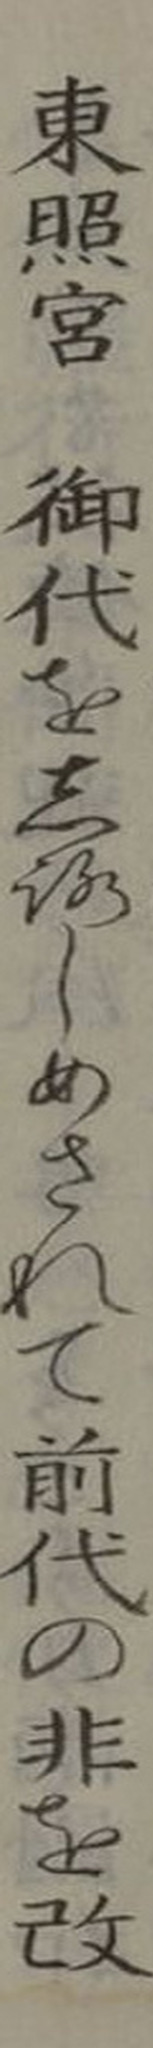東照宮御代をしろしめされて前代の非を改
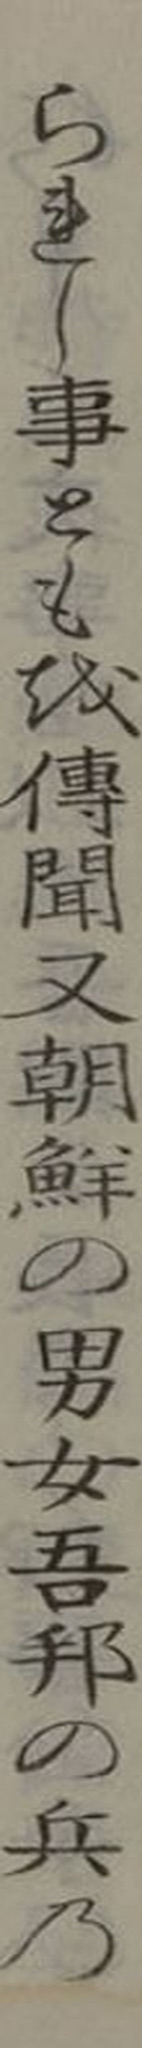られし事ともを傳聞又朝鮮の男女吾邦の兵の
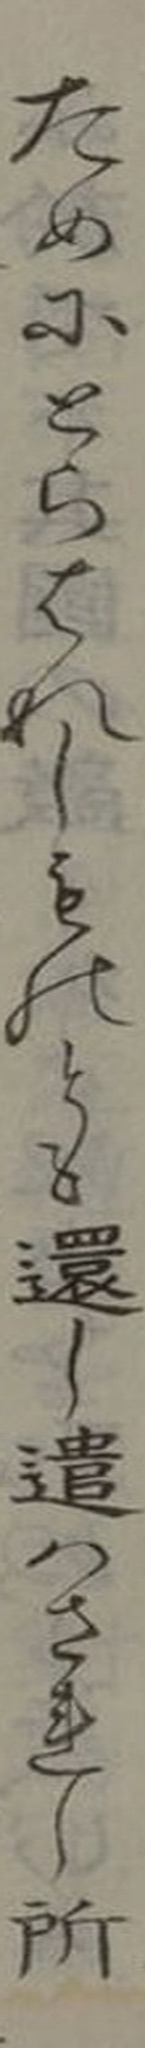ためにとらはれしものとも還し遣はされし所
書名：骨董録
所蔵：University of the Ryukyus Library
